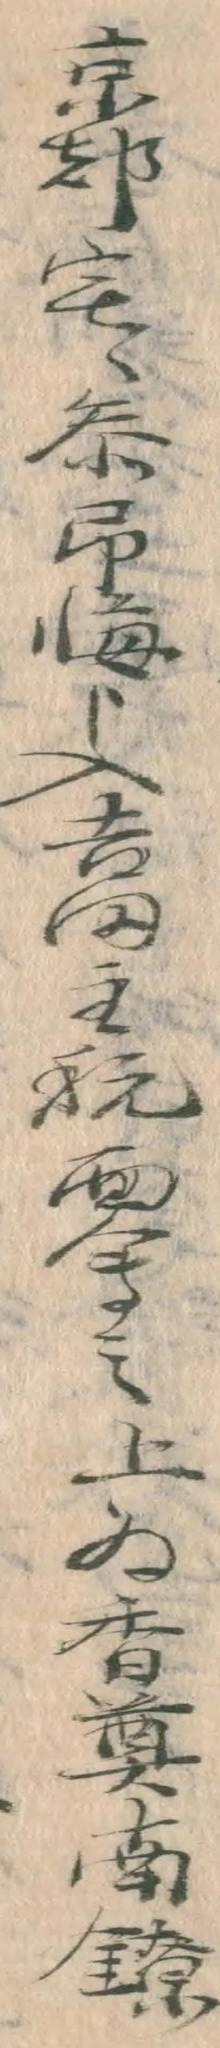京都宅へ参即悔申入吉田主税面會之上為香奠南鐐
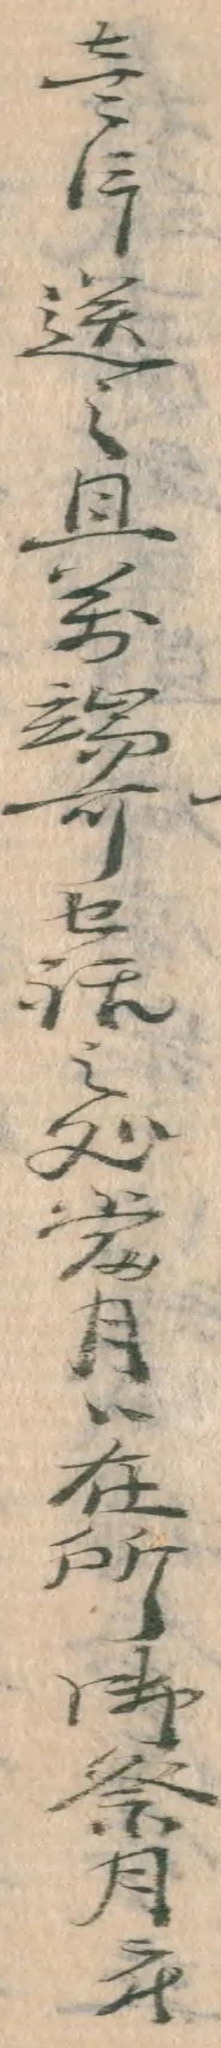壱片送之且萬端可世話之処當月ハ在所御祭月ニ付
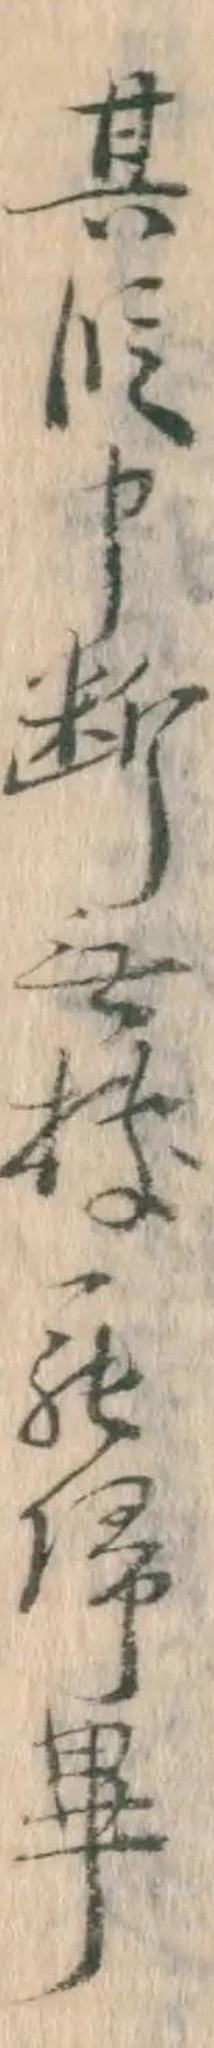其段申断無拠罷帰畢
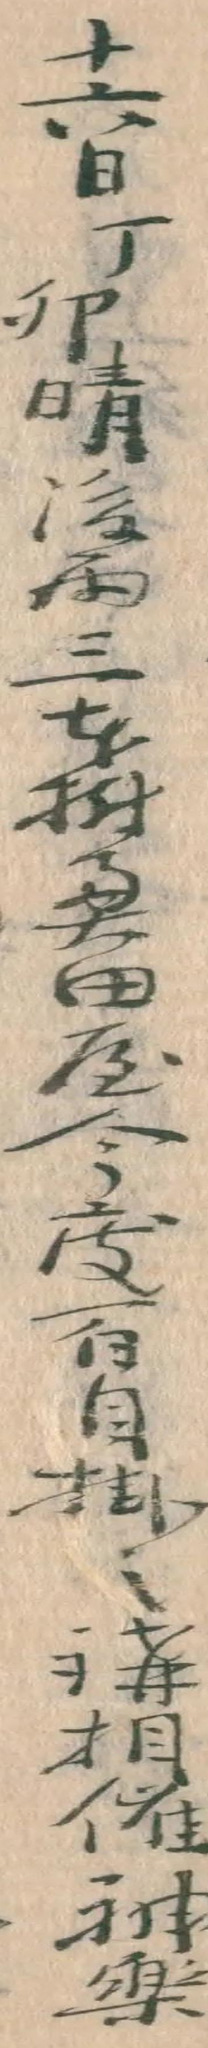十六日丁卯晴後雨三本拊奥田屋今度有自掛之講相催神楽
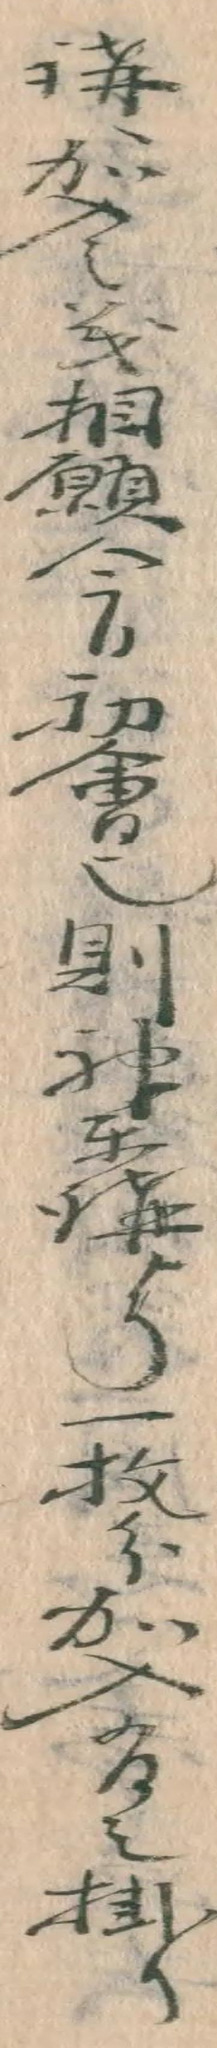講へ加入之義相願今日初會也則神東講より一枚分加入有之掛リ
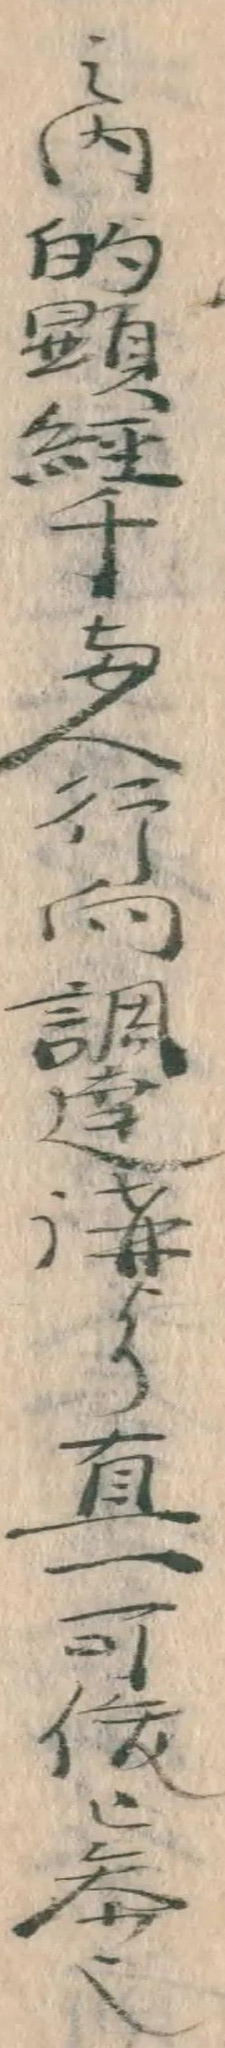之内的顕経千両人行向調定講より直一可俊被参也
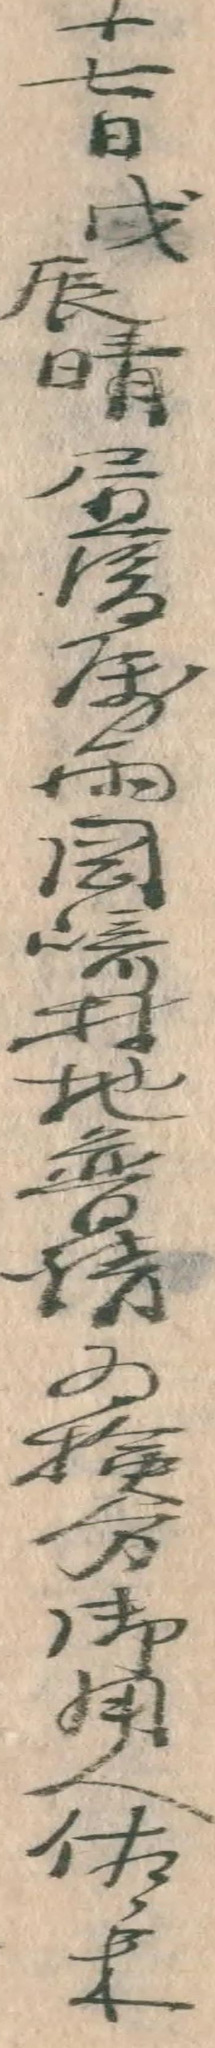十七日戊辰晴昼後属雨岡崎村地普請為検分御用人佐々木
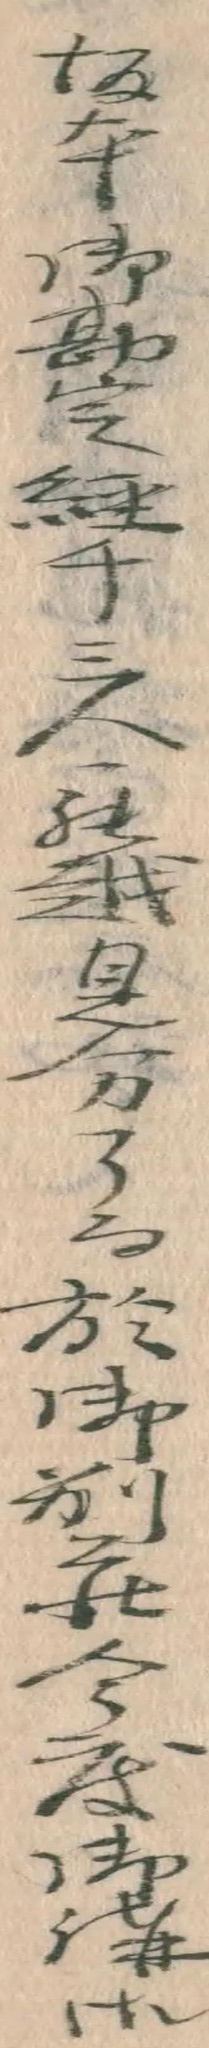坂本御勘定経千三人罷越見分了而於御別荘今度御講御
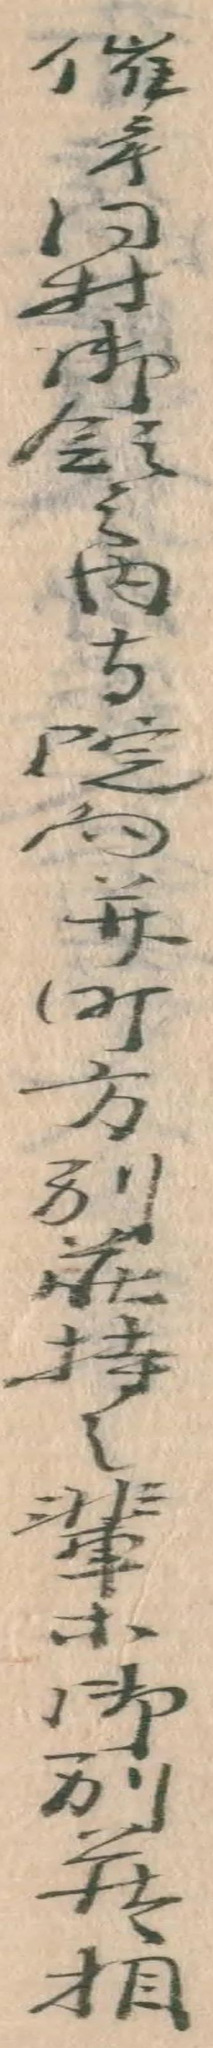催ニ付同村御領之内寺院向幷町方別荘持之輩等御別荘相
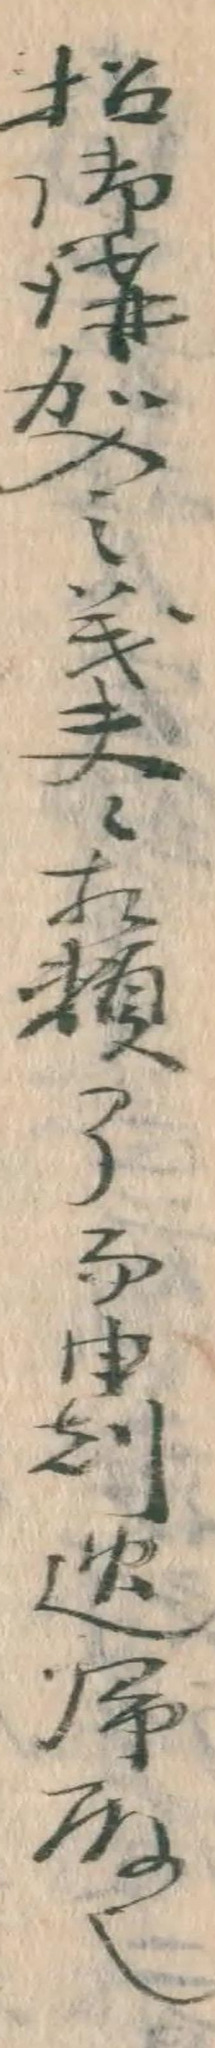招御講加入之義夫々相頼了而申刻退帰殿也
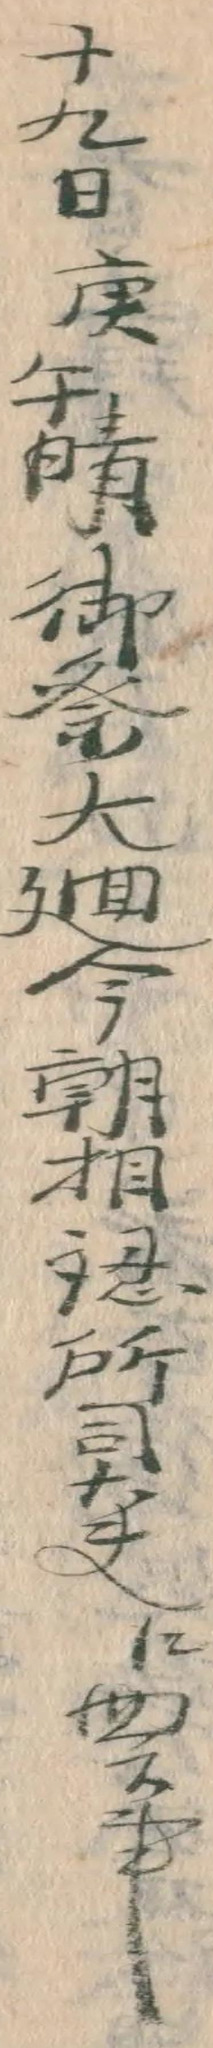十九日庚午晴御祭大廻今朝相認所司大夫え回事
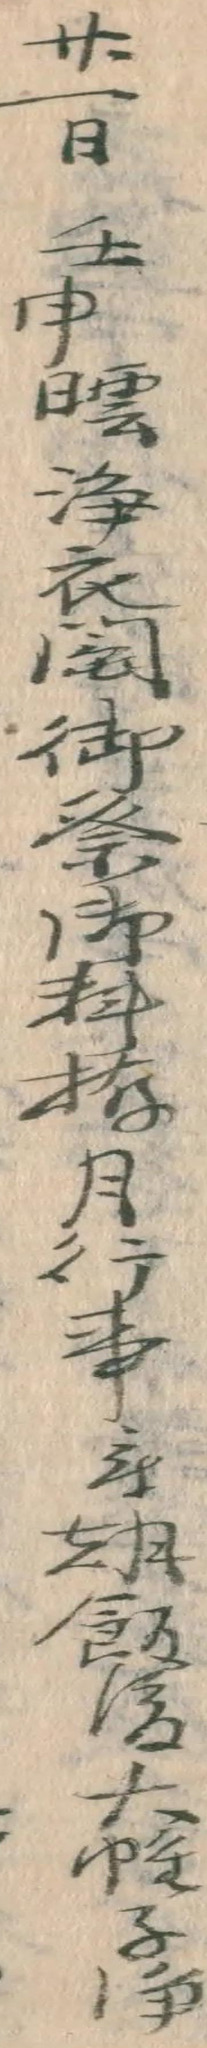廿一日壬申曇浄花鬮御祭御料拵月行事ニ付朝飯後大帷子浄
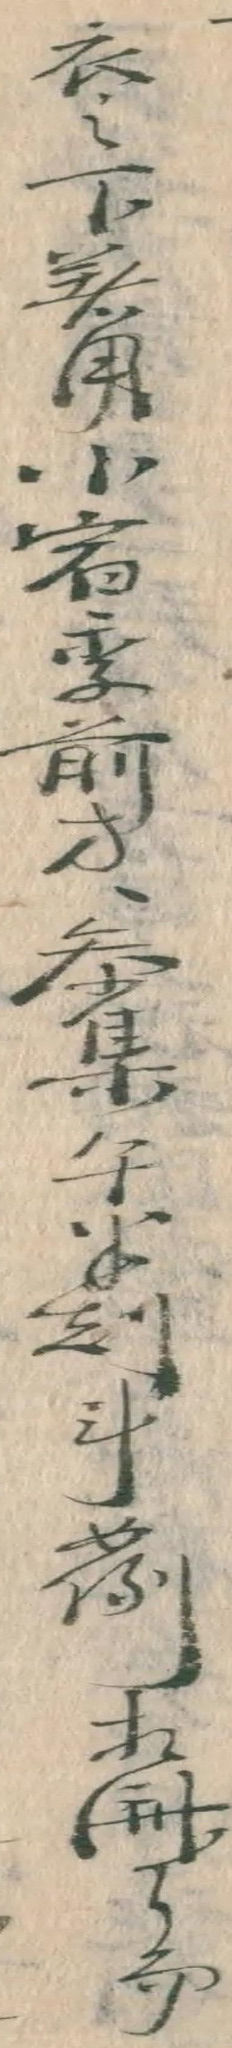夜之下着用小宿季前方へ参集午半刻斗如例相済了而
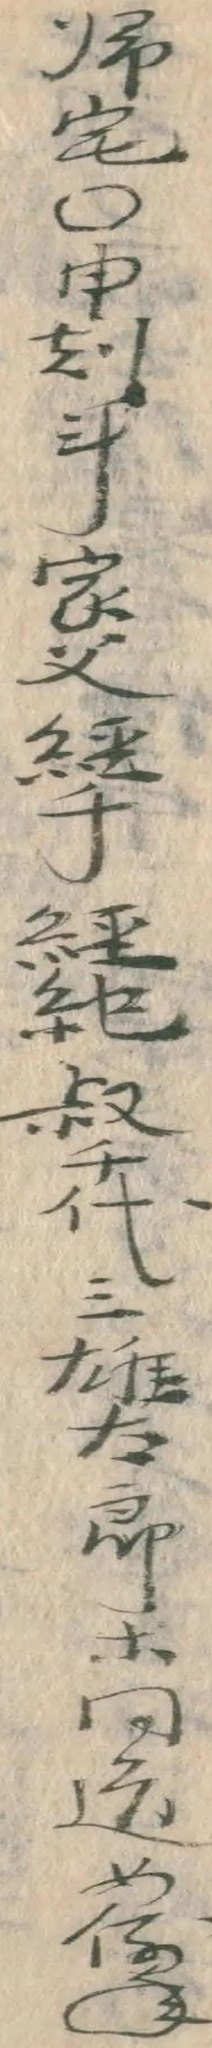帰宅○申刻斗家父経千経紀叔千代三雄太郎等同道如例年
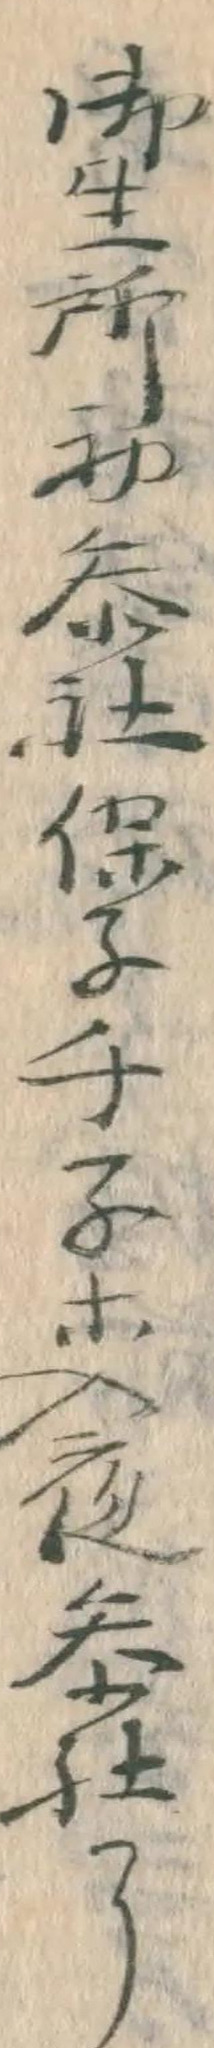御生所初参社保子千子等入夜参社了
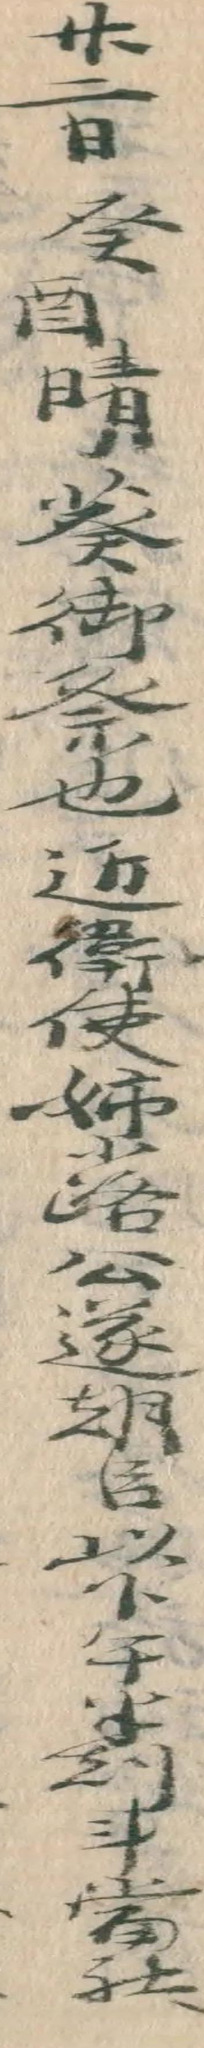廿二日癸酉晴葵御祭也近衛使姉小路公遂朝臣以下午半刻斗當社
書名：賀茂社記録. 第65冊
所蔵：国立国会図書館 National Diet Library, JAPAN
